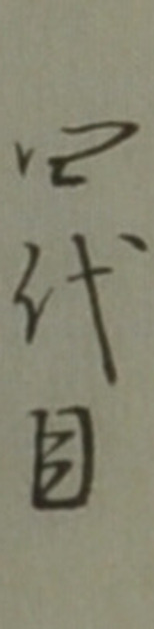四代目
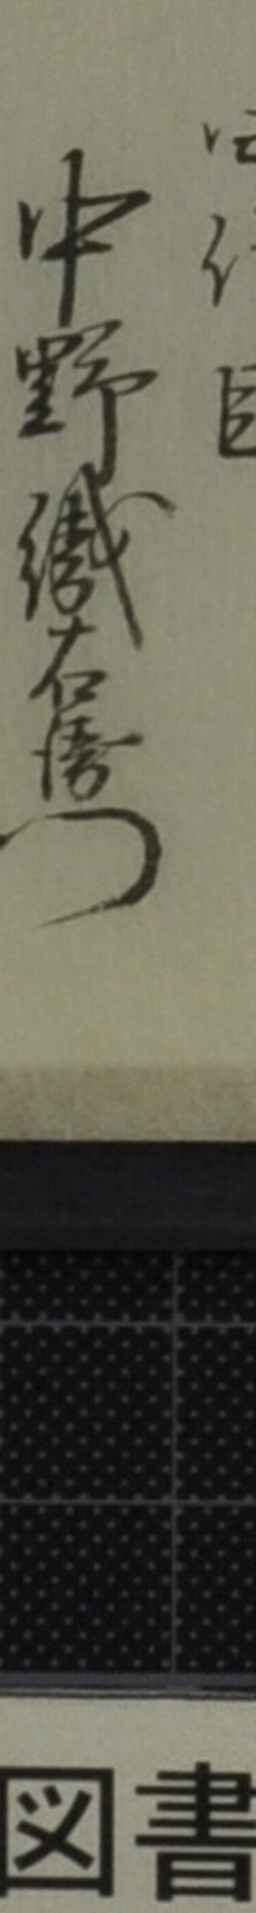中野織右衛門
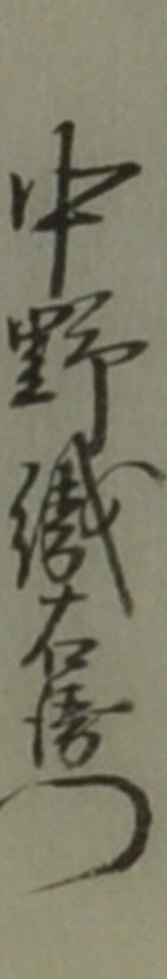中野織右衛門
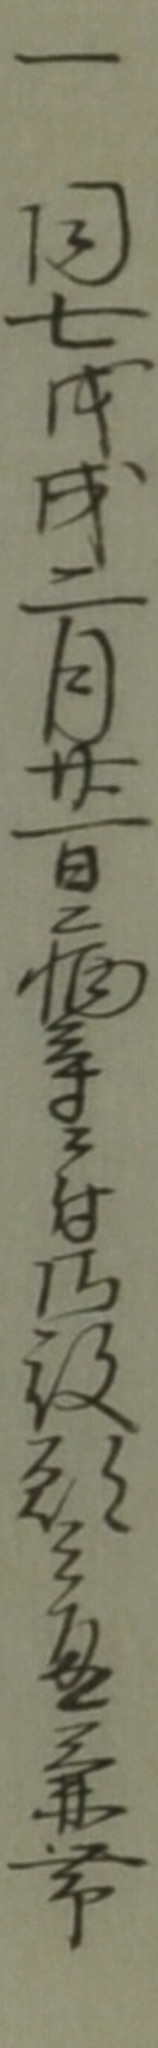一同七戊戌二月廿一日病気ニ付御役願之通兼帯
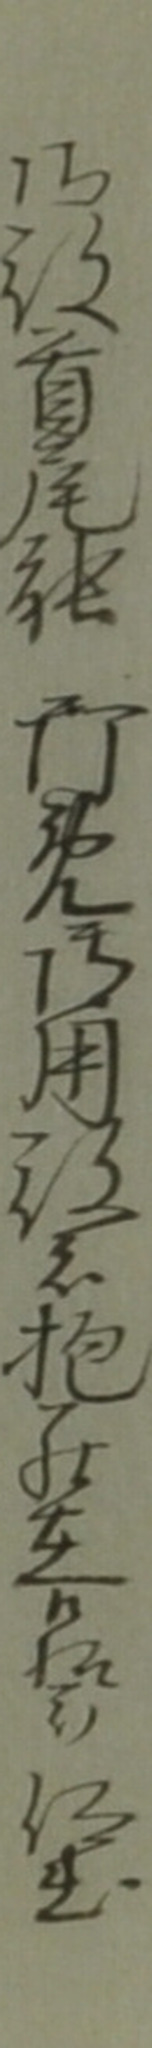御役首尾能御免御用役は抱罷在候様被仰出
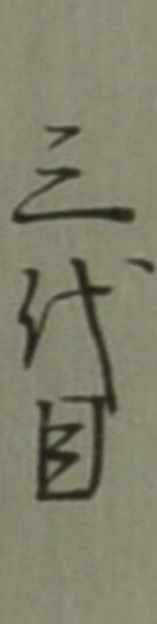三代目
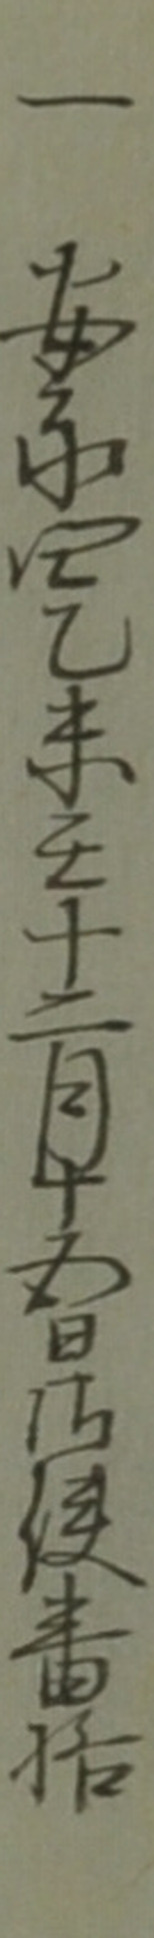一安永四乙未閏十二月十五日御使番格
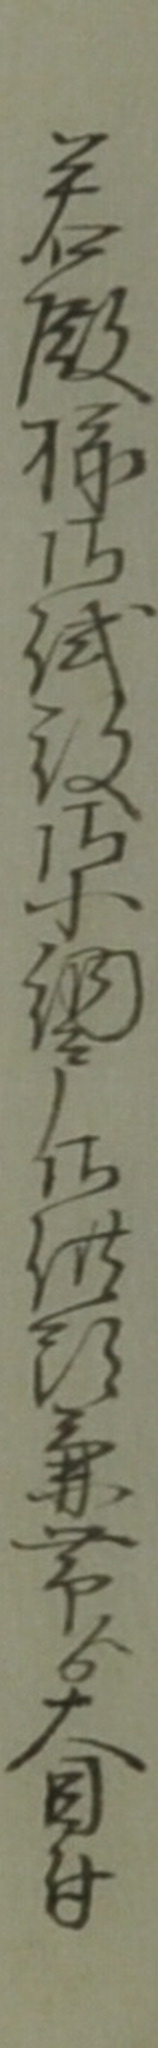若殿様御試役御小納戸御供頭兼帯ゟ大目付
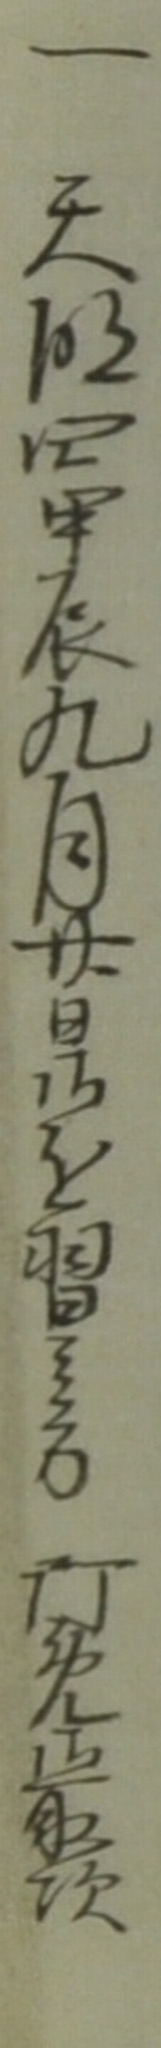一天明四甲辰九月廿日御近習之方御免御取次
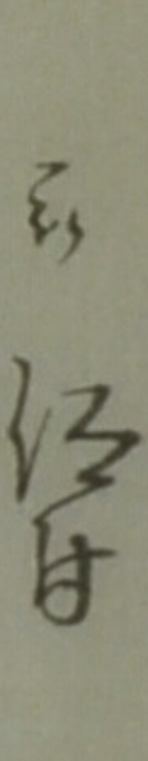被仰付

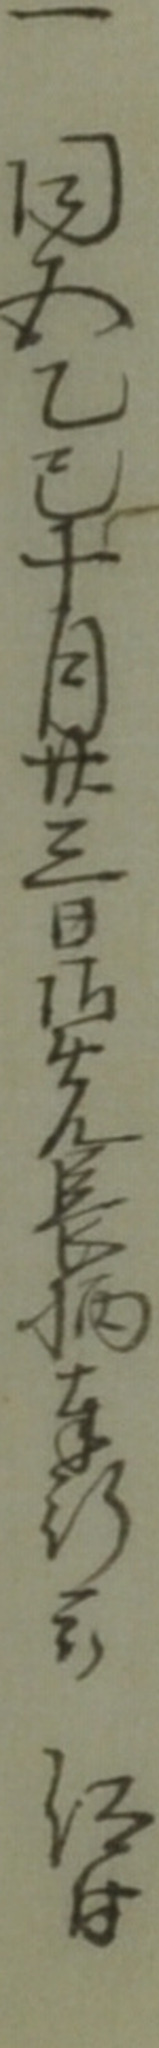一同五乙巳十月廿三日御先長柄奉行被仰付
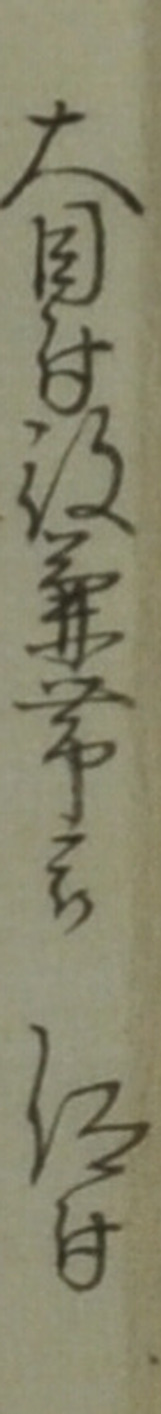大目付役兼帯被仰付
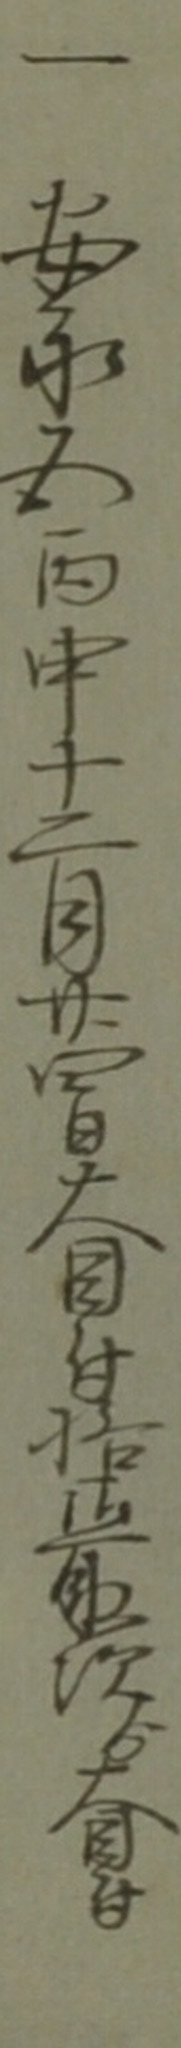一安永五丙申十二月廿四日大目付格御取次ゟ大目付
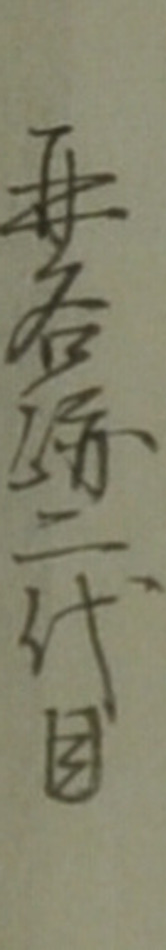再名跡二代目
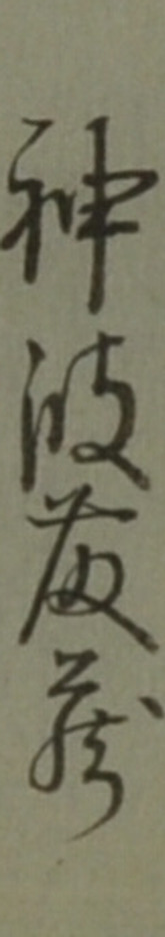神波藤蔵
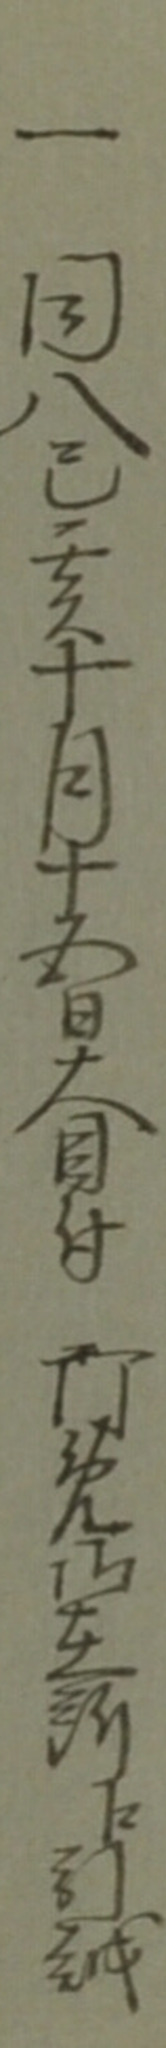一同八己亥十月十五日大目付御免御在所江引越
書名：諸御役代々録（三）
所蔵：伊那市立高遠町図書館・合同会社AMANE
